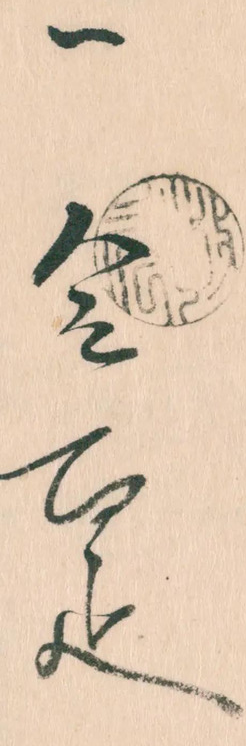一金百疋
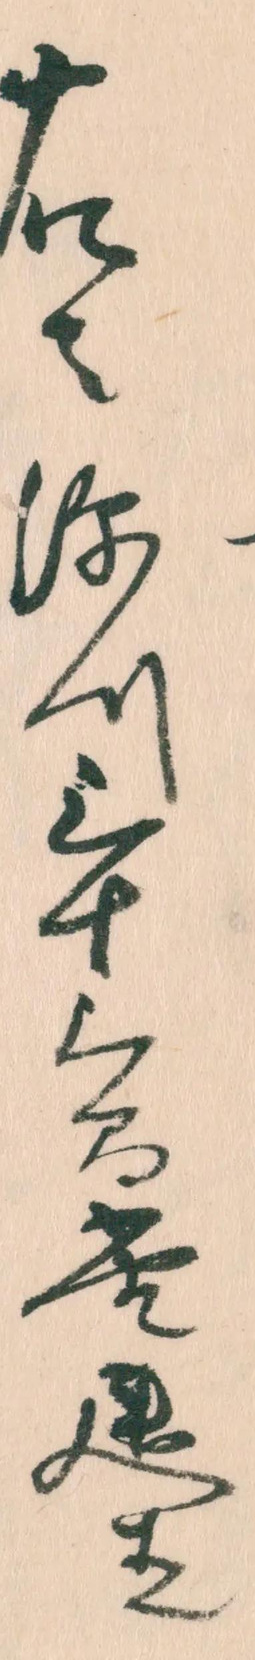右は深川三十三間堂建直
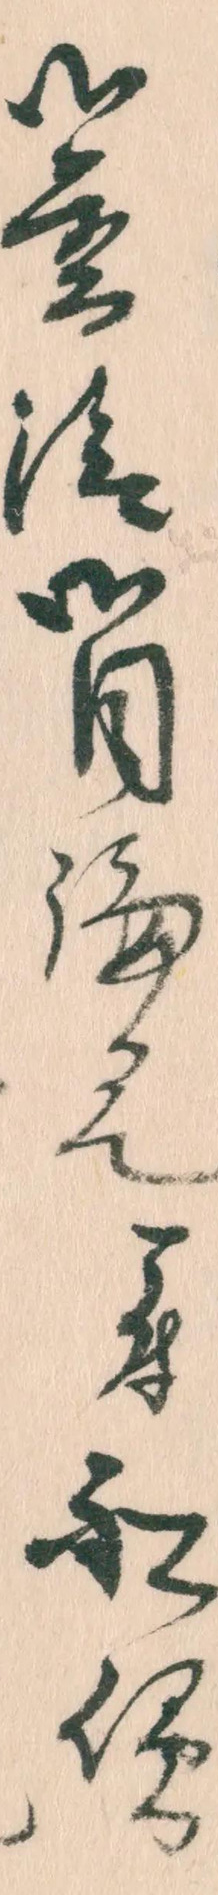御普請御目論見ニ付船賃
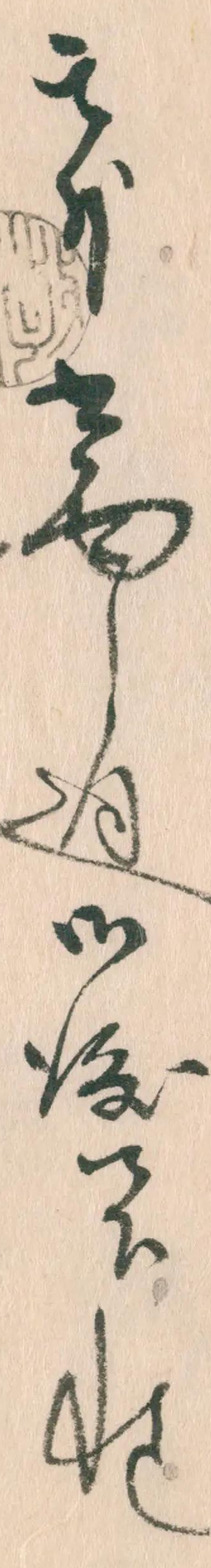其外書面之通御渡被下慥
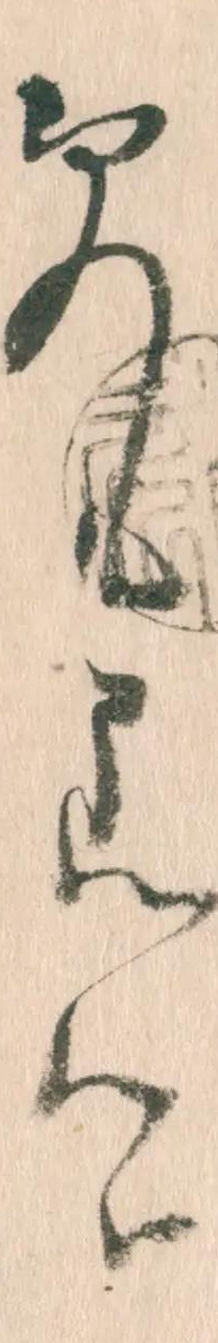受取申候以上

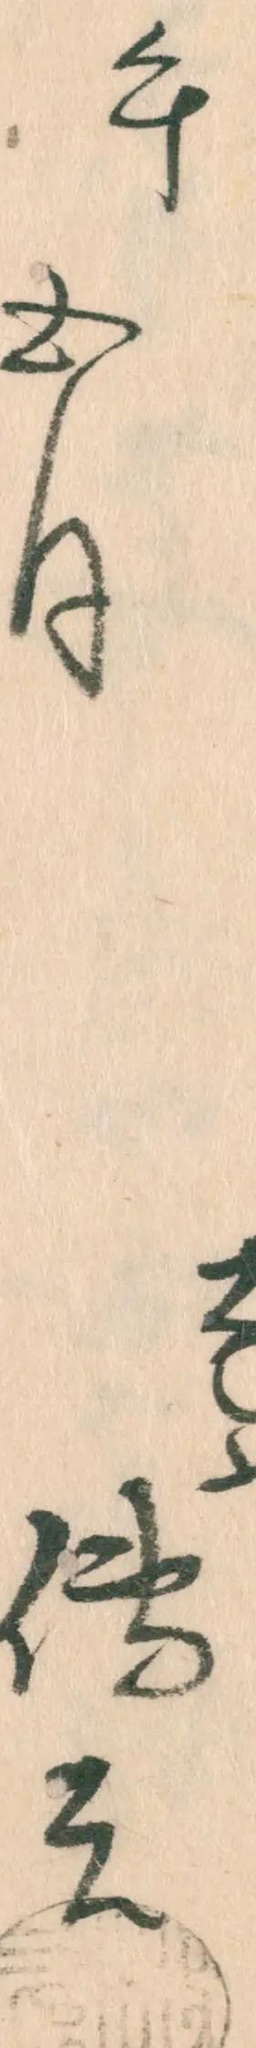五月伝吉㊞
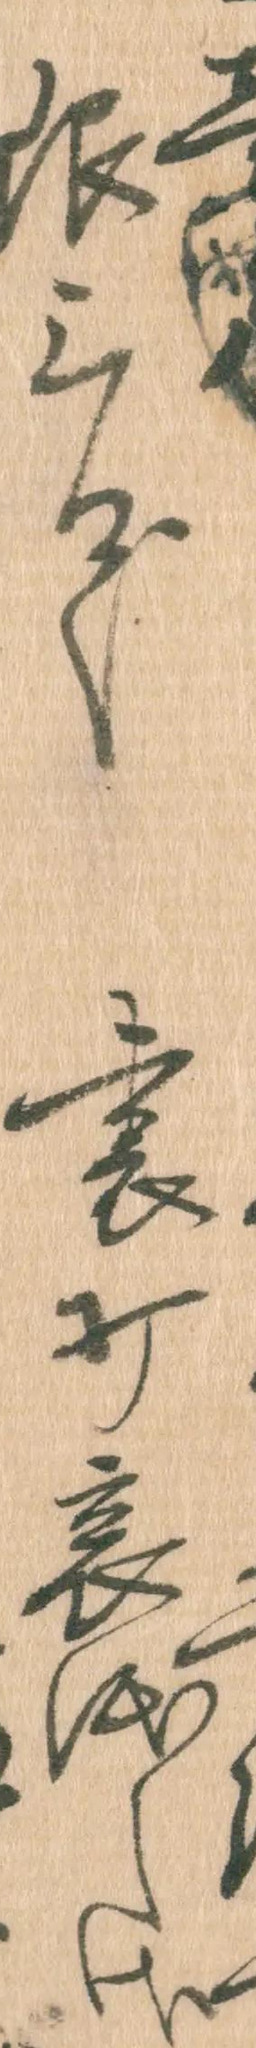銀三匁裏打裏紙之代
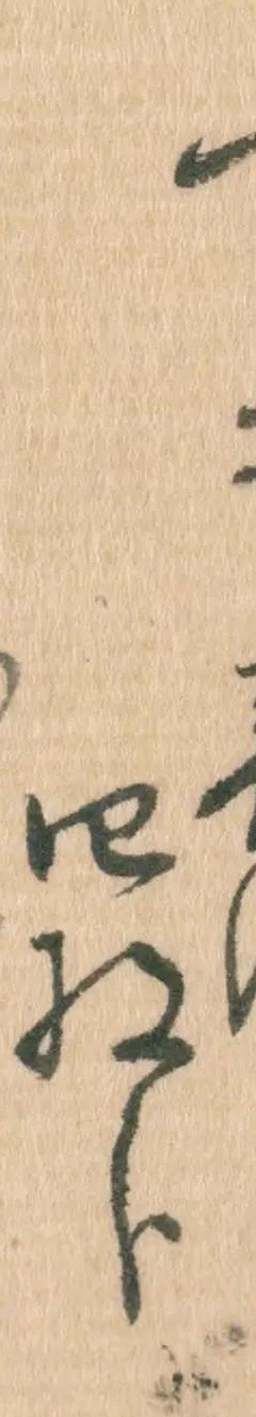四枚分
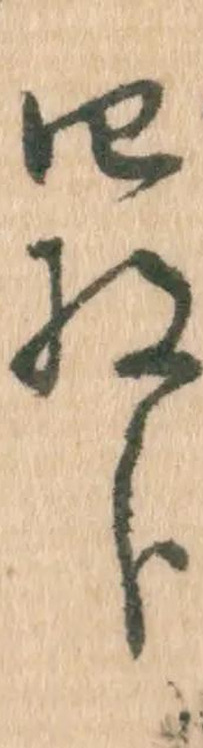四枚分

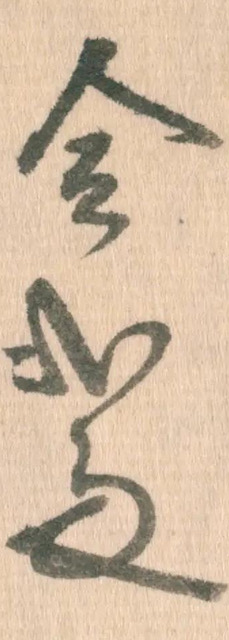一金弐両
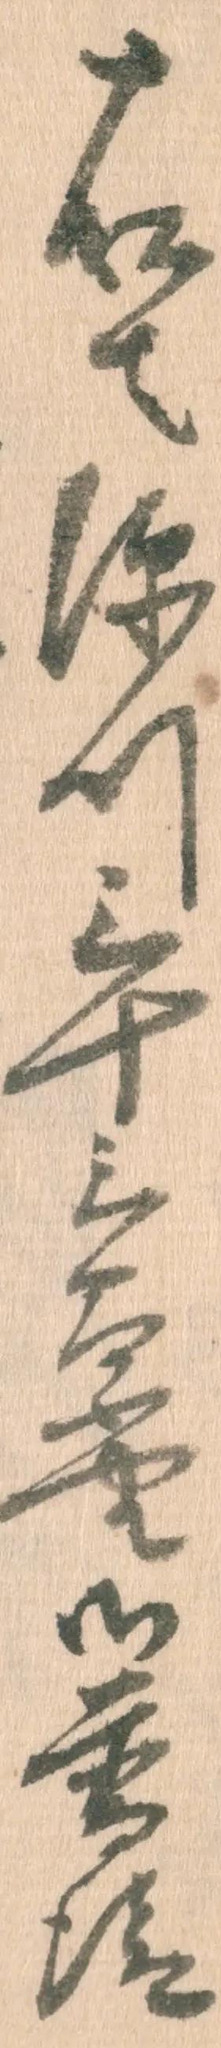右は深川三十三間堂御普請
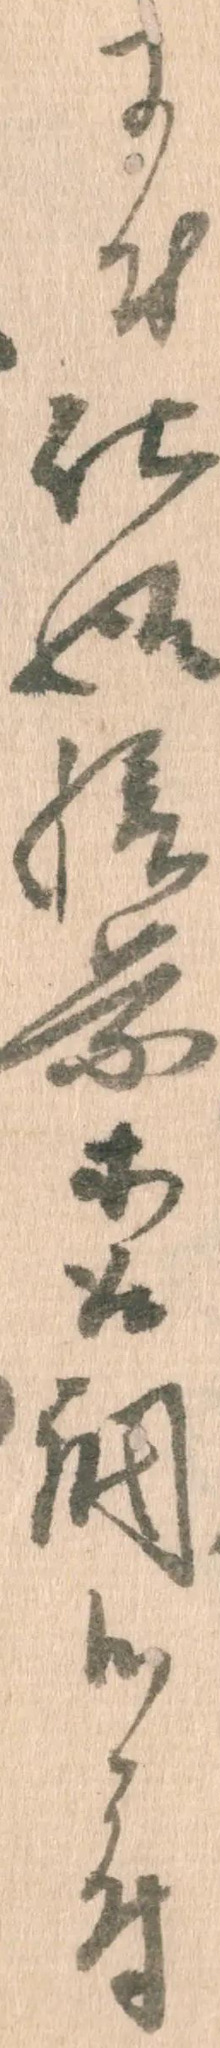に付仕様絵図等取調候ニ付
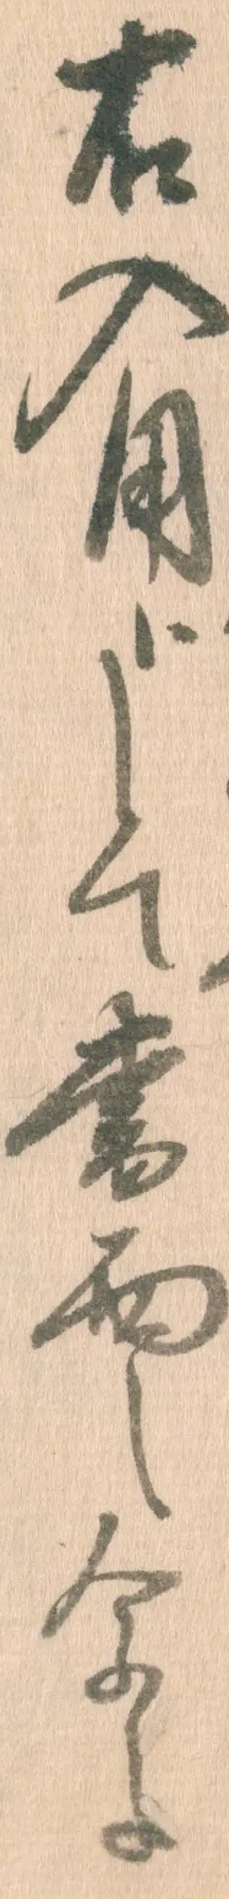右入用トして書面之金子

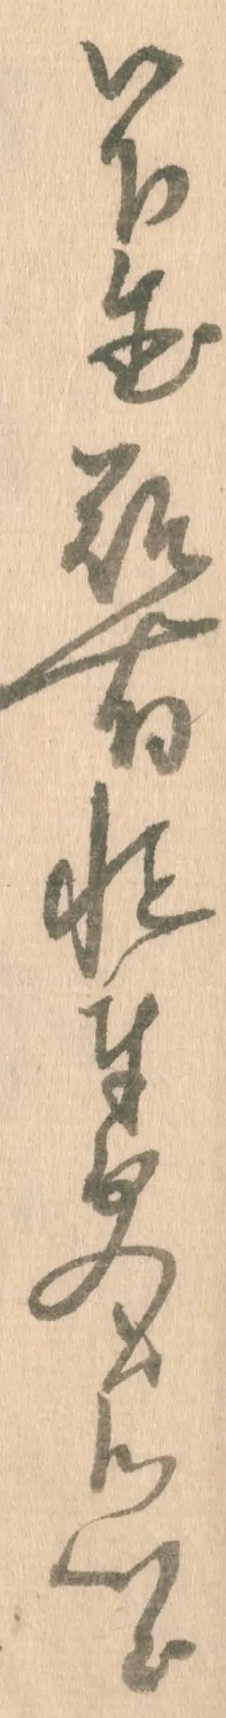被下置難有慥奉受取候以上
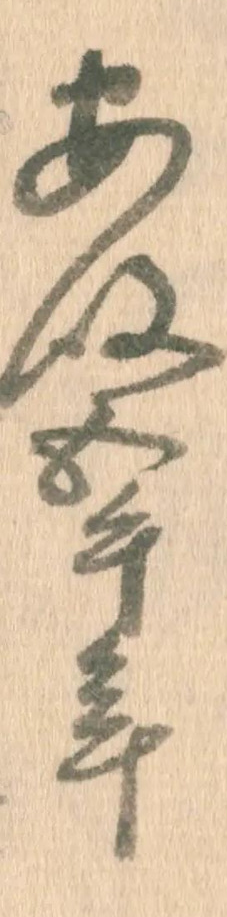安政五午年
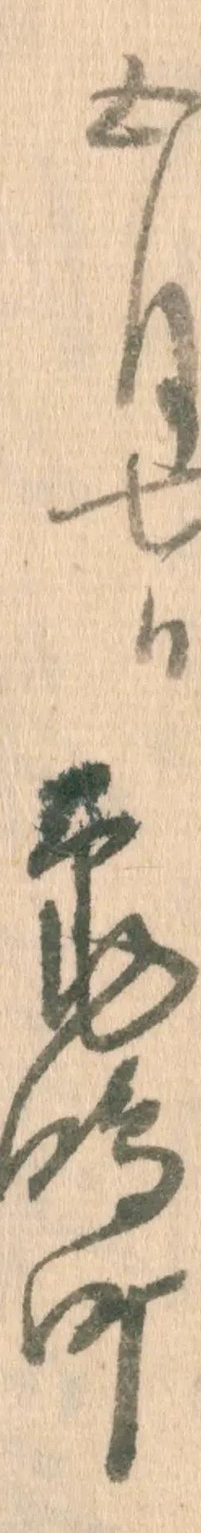五月七日亀島町
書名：三十三間堂. [2]
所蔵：国立国会図書館 National Diet Library, JAPAN
